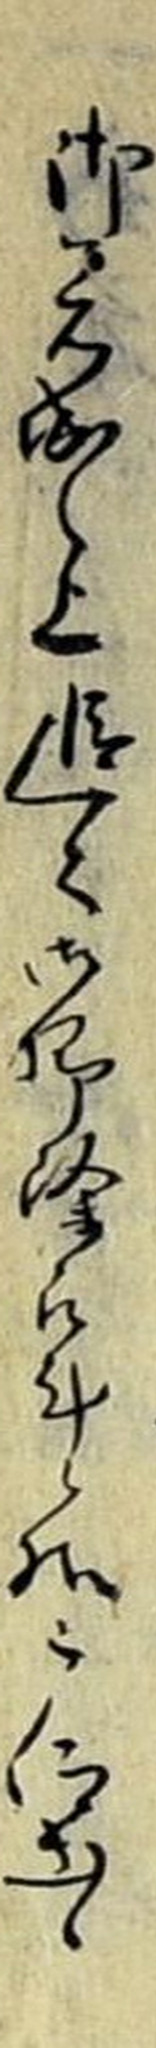御着城之上追々御掃除取斗候様被仰出候
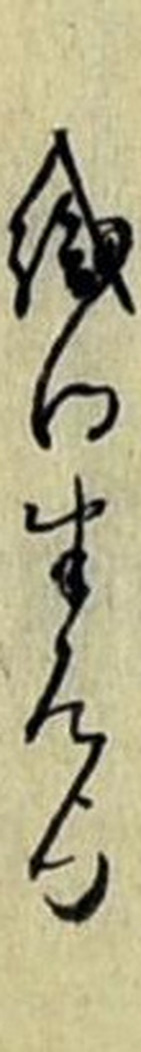織田半左衛門
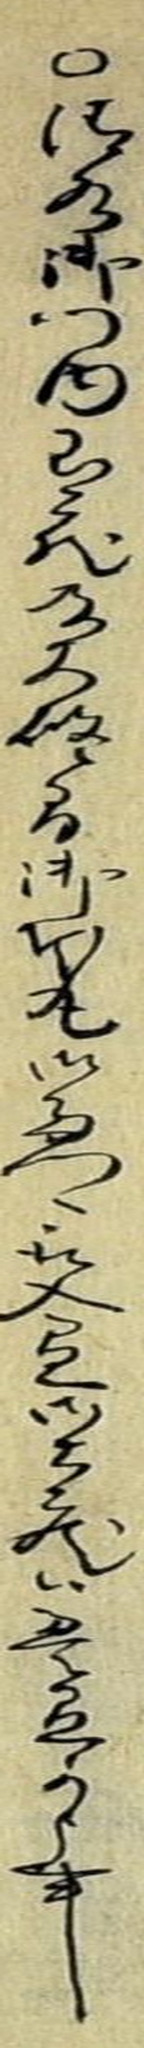○清水御門内玉蔵及大破候間御本丸御多門へ取入置御土蔵は畳置可申事
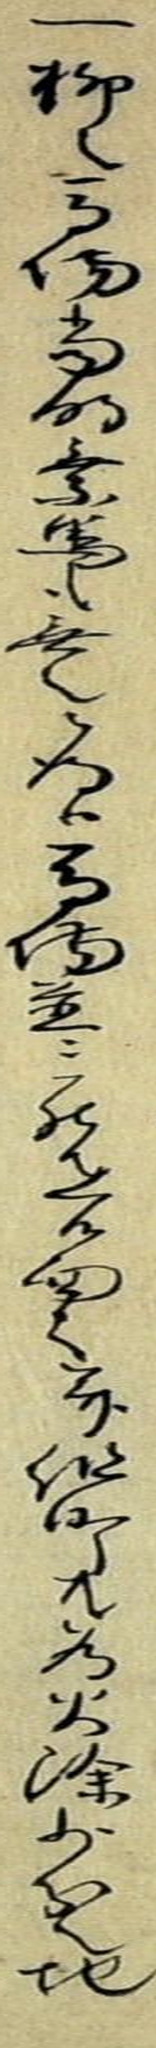一柳之馬場当時乗馬も無之候得は馬場並に罷在候面々并組町共為火除少分之地
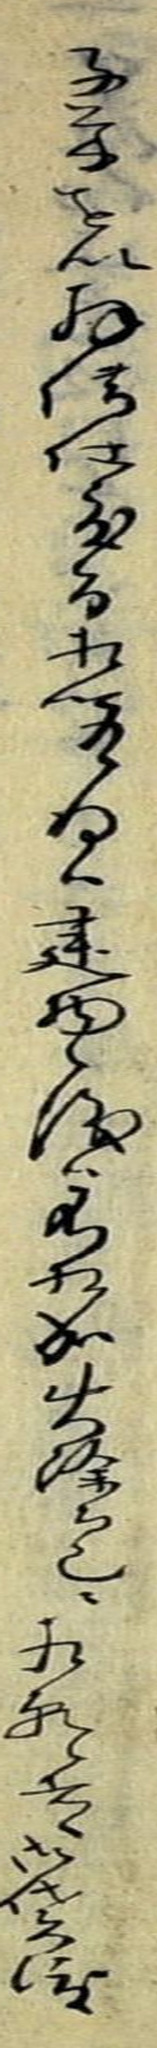子米を以拝借仕度旨相聞候得は建物之儀は不相成火除而己に相願候者へ御貸渡
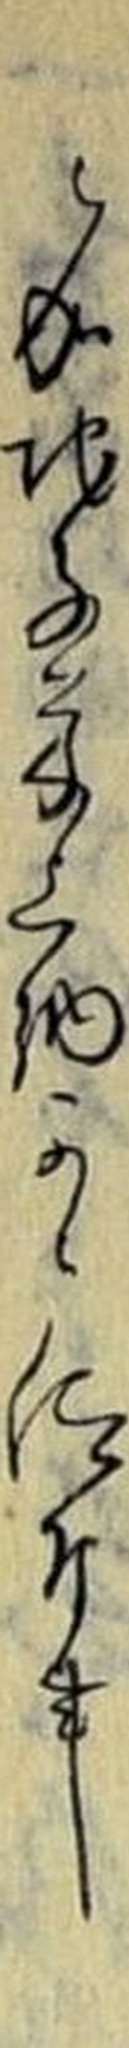被成地子米上納可被仰付事
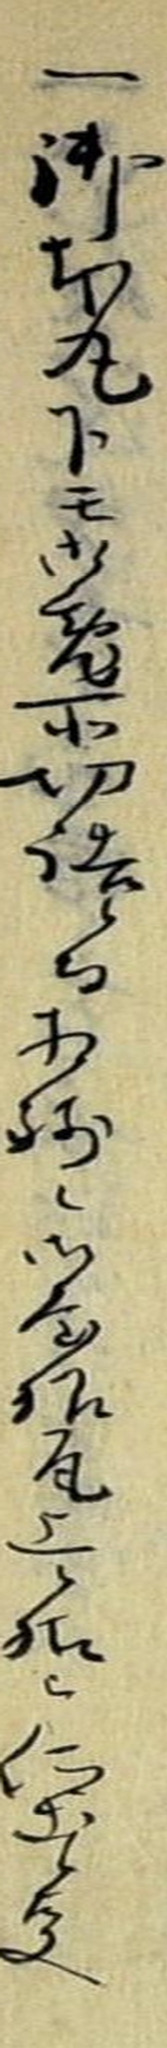一御本丸下モ御台所切詰候而相残候御屋根瓦上候様被仰出候事
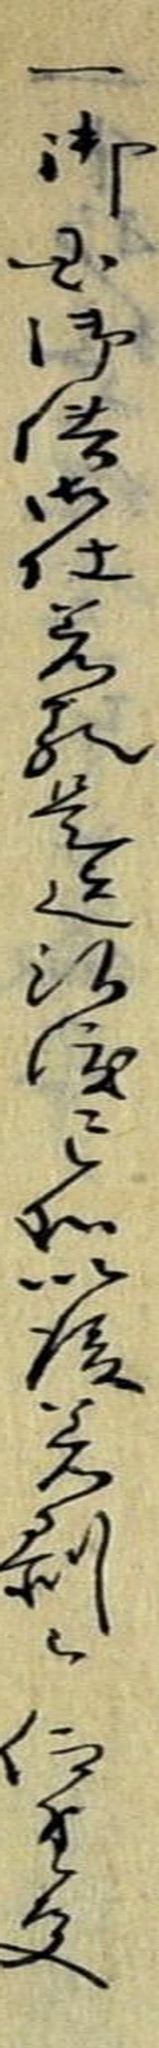一御国御借御仕着類是迄銀渡に候処以後着剥被仰付候事
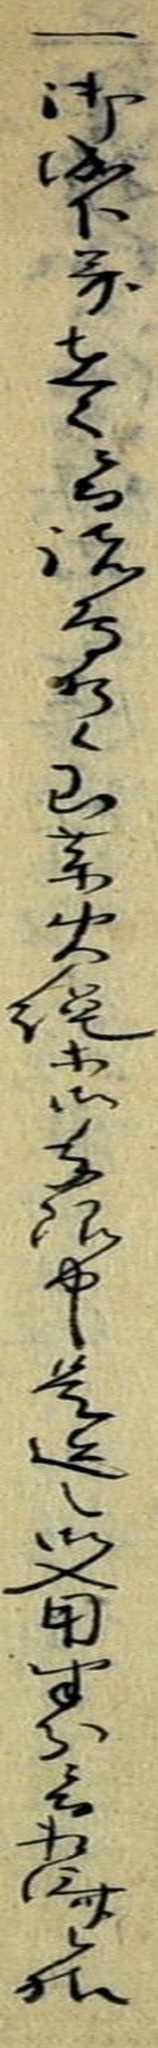一御城下并在々に而諸鳥打候玉薬火縄等御年限中是迄之御入用半分に而相済候様
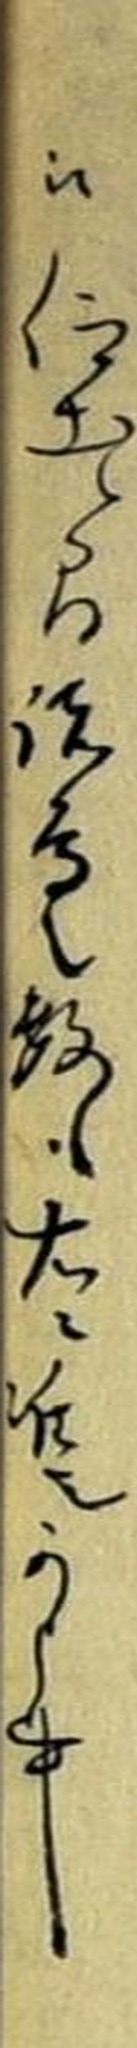被仰出候間諸鳥之数も右に准し可申事
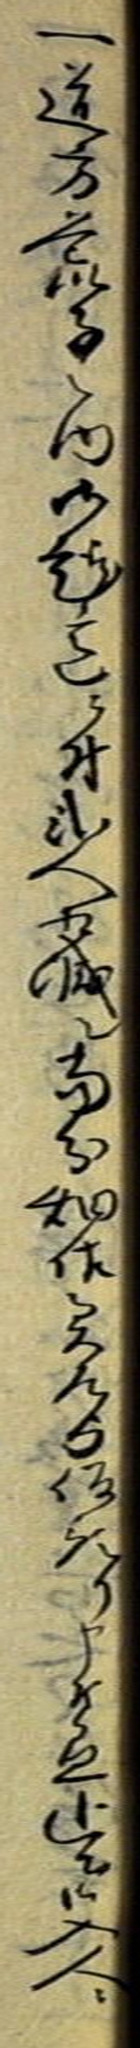一道方荒子之内御趣意に付弐人相減し当分畑佐奥左衛門仮預り申付置追而御入人に
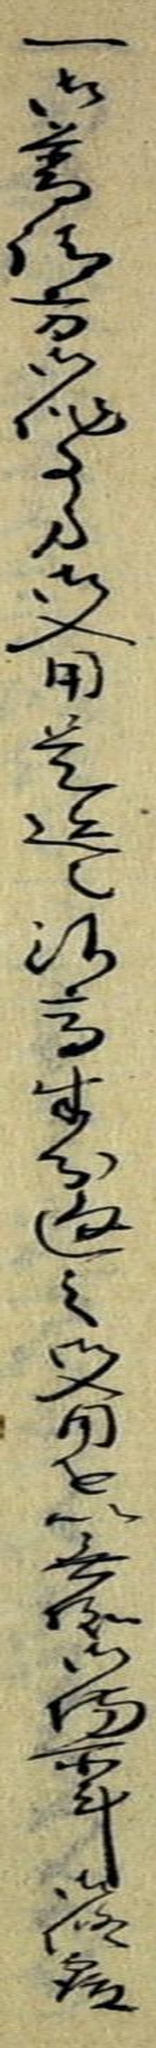一御普請方御作事方御入用是迄之銀高半分通之御入用を以無拠御場所斗御修覆
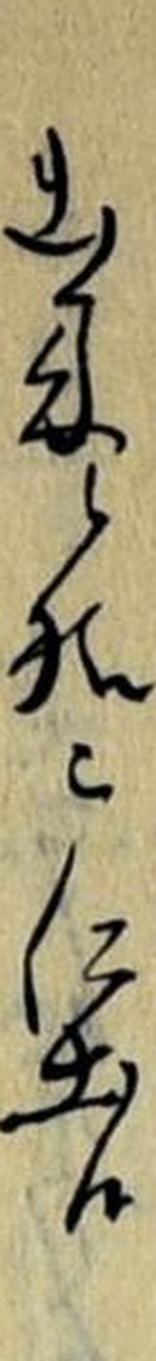出来候様被仰出候
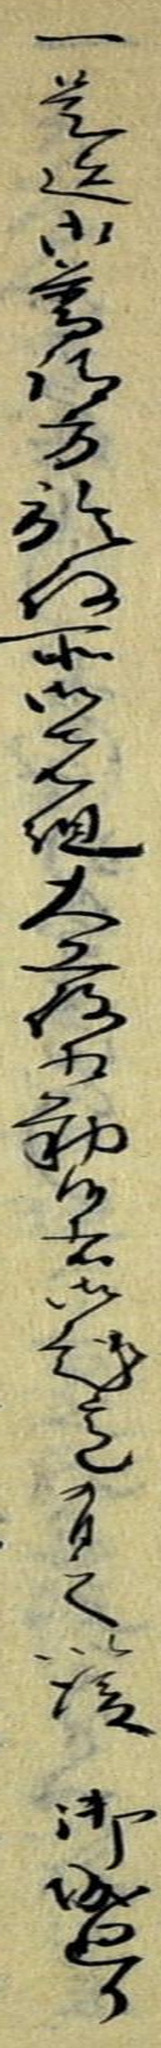一是迄御普請方於役所御先組大工役相勤候者御趣意有之以後御城廻り
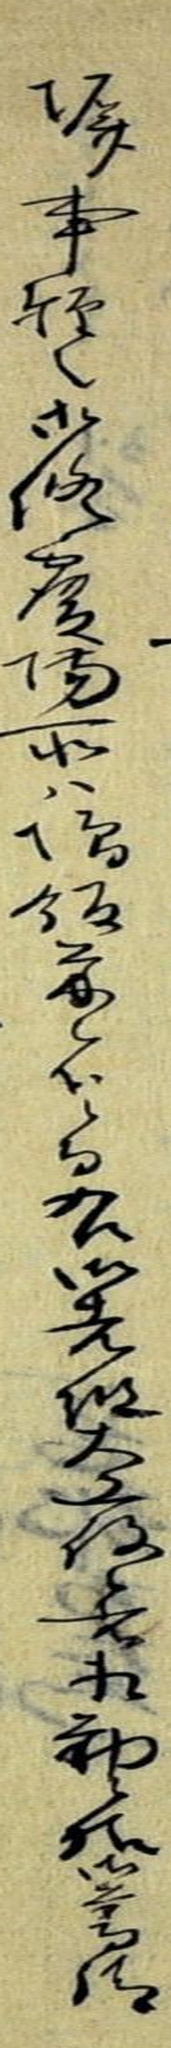塀事軽之御修覆場所は増飯米被下候而右御先組大工役之者相勤候様御普請
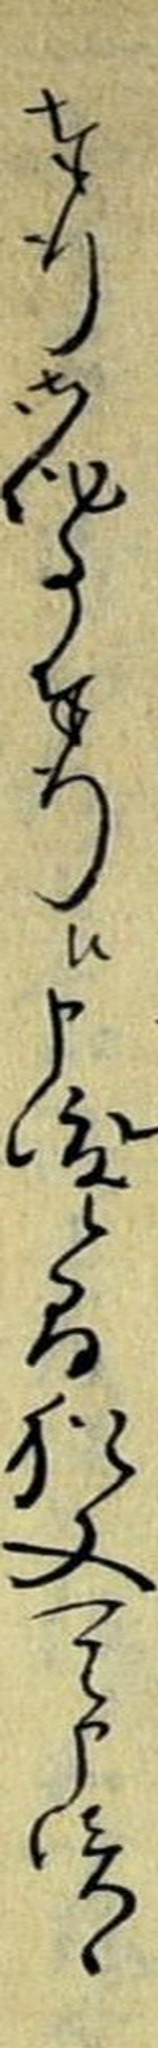奉行御作事奉行江申渡候間猶又可被申渡候
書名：命令之部 四
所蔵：福井県文書館 Fukui Prefectural Archives
